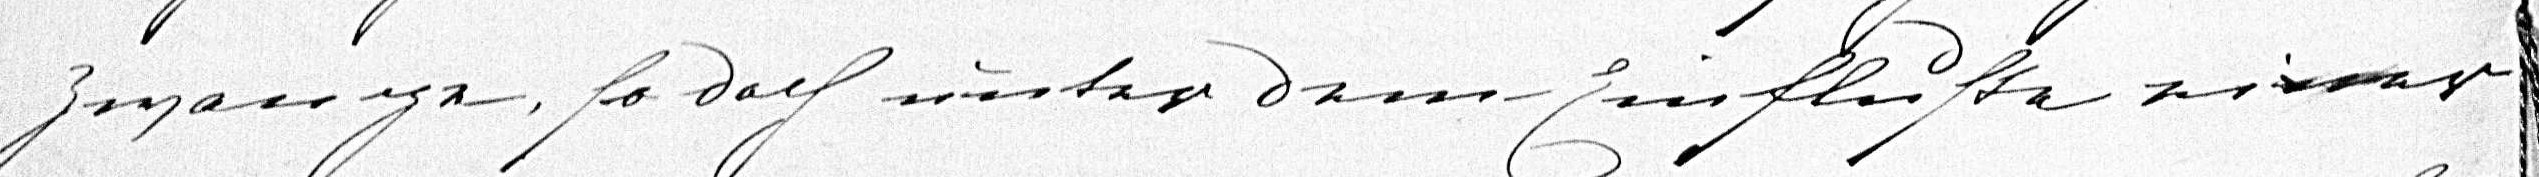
Zwange, so dach unter dem Einfluste einer
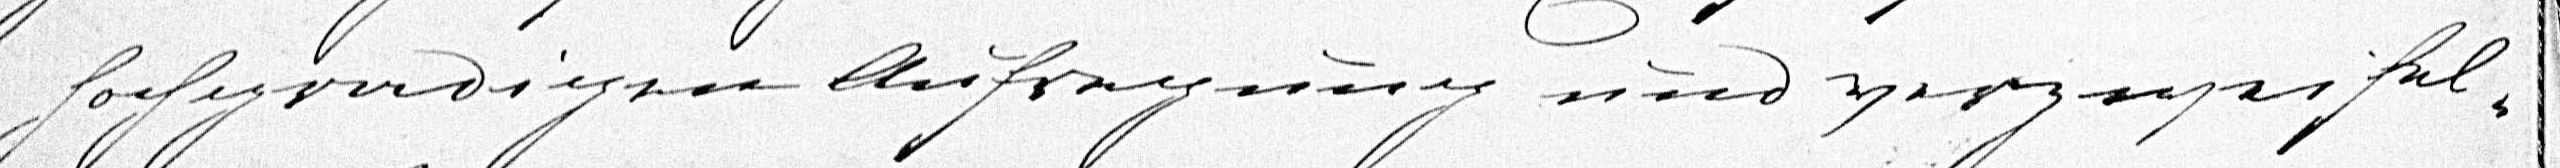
Hochgradigen Aufregung und verzweifel¬
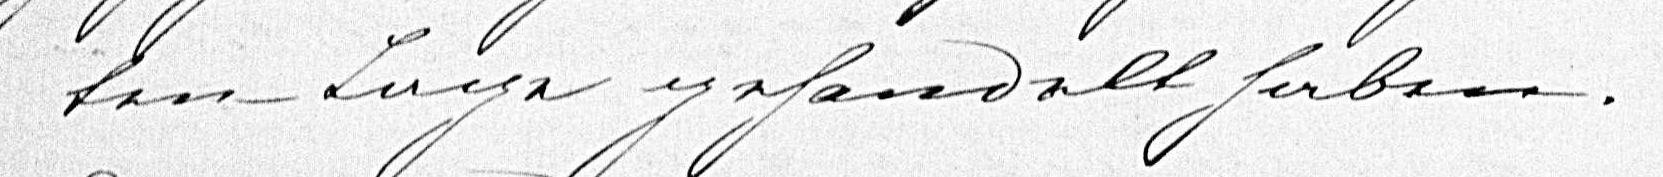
ten Lage gehandelt haben.
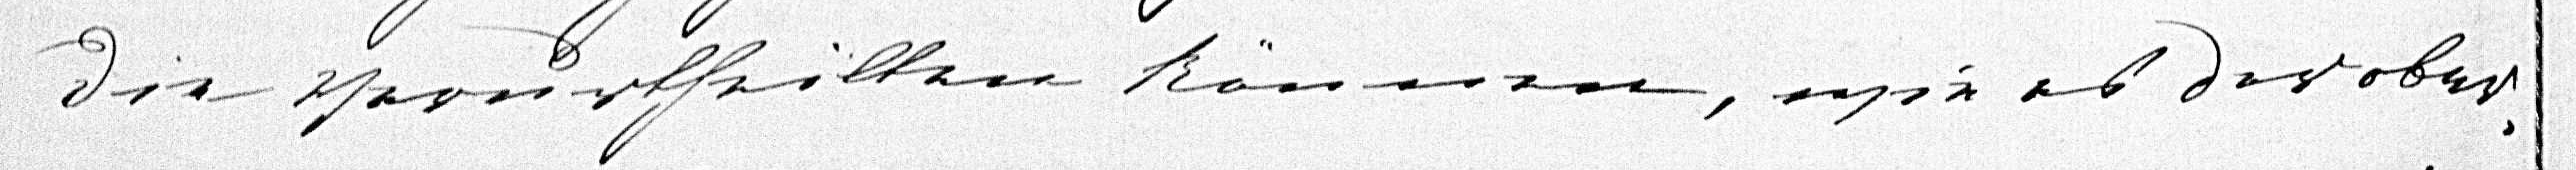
Die Verurtheilten können, wie es dersber¬
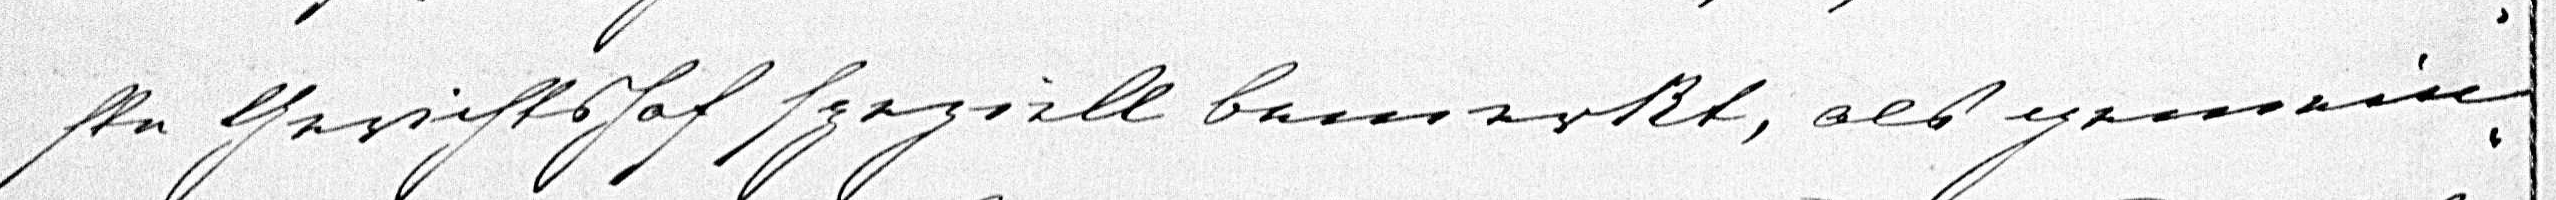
ste Gerichtshof speziell bemerkt, als gemein
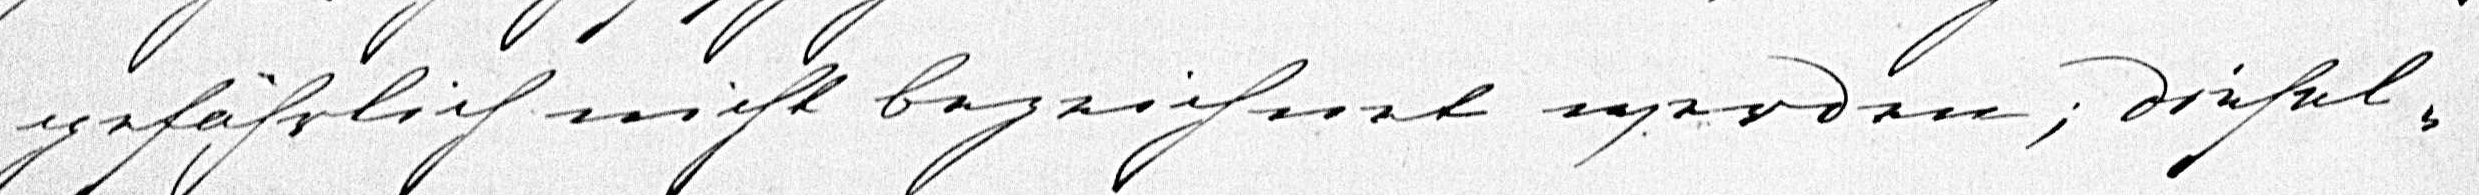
gefährlich nicht bezeichnet werden; diesel¬
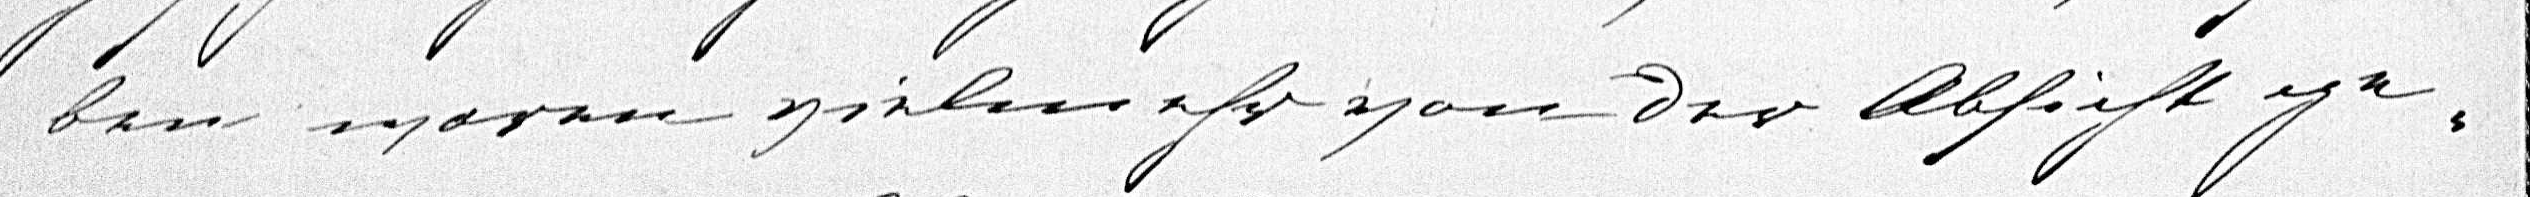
ben woren vielmehr von der Absicht ge¬
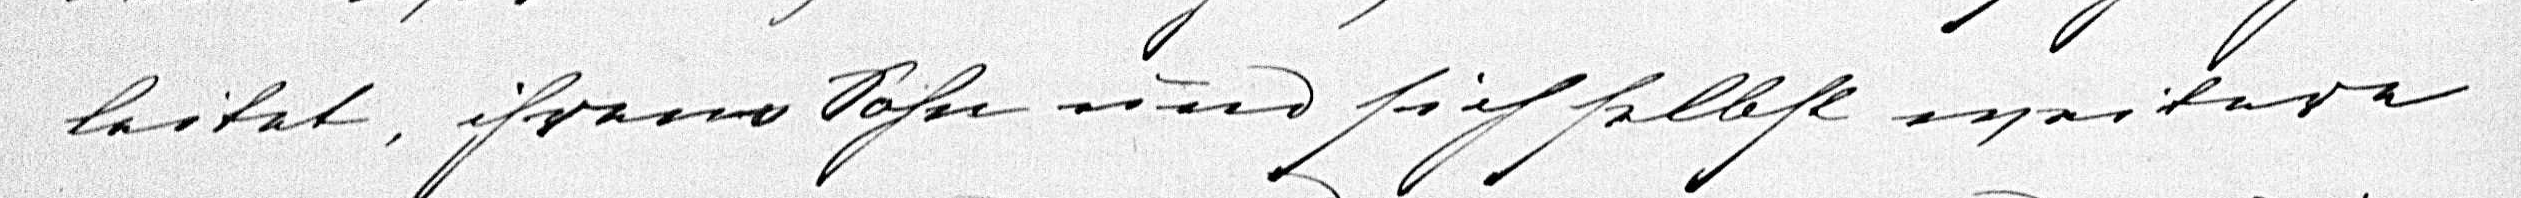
leitet ihrem Sohn und sich selbst weitere
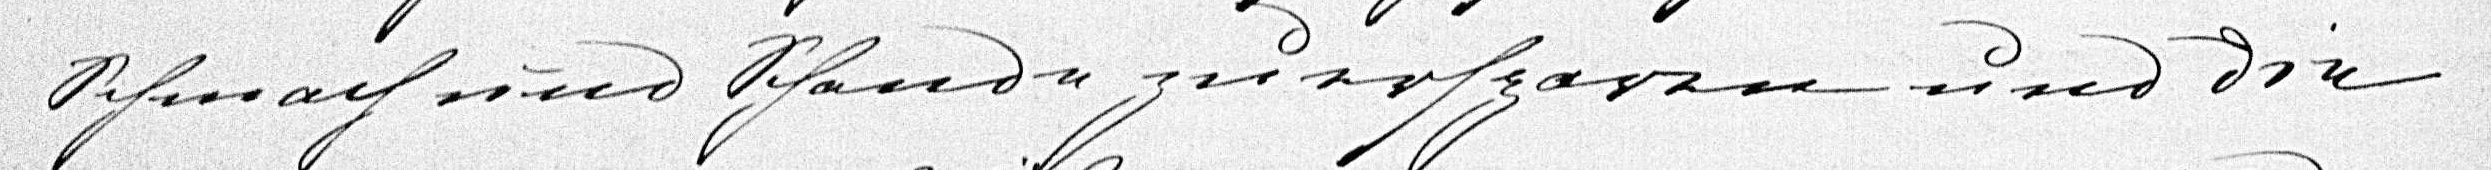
Schmach und Schande zu erszoren und die
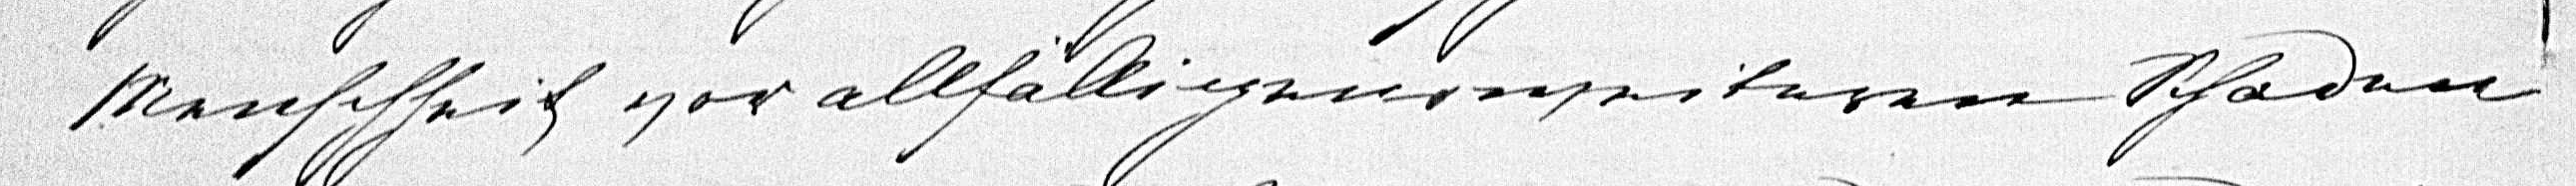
Menschheit vor allfälligeneweiteren Schaden
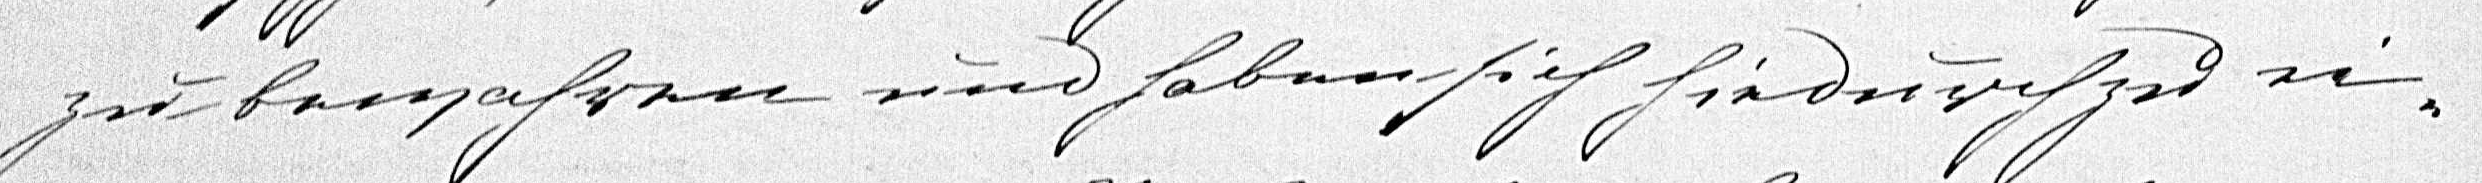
zu bewahren und haben sich hiedurch zu ei¬
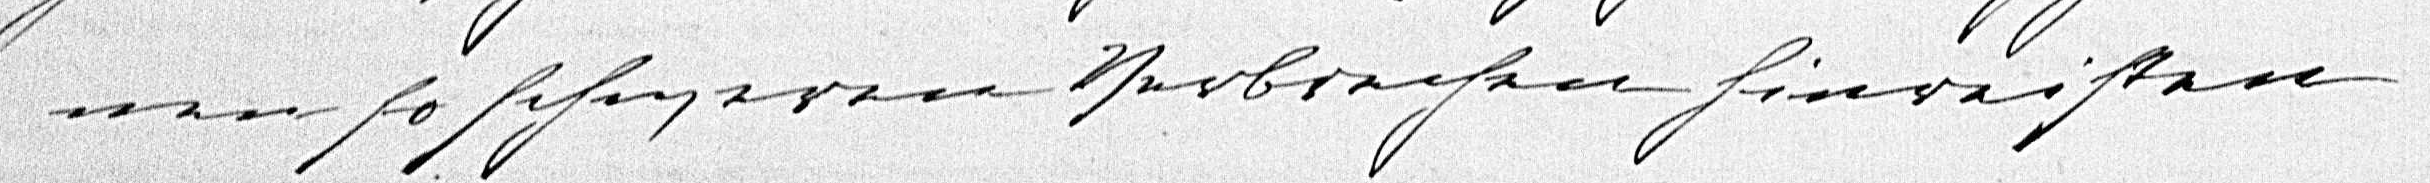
nen so schweren Verbrechen Hinreisten
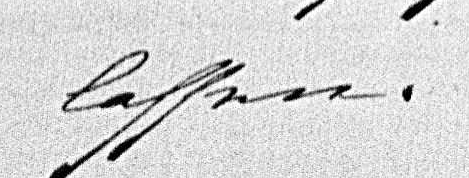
lassen.
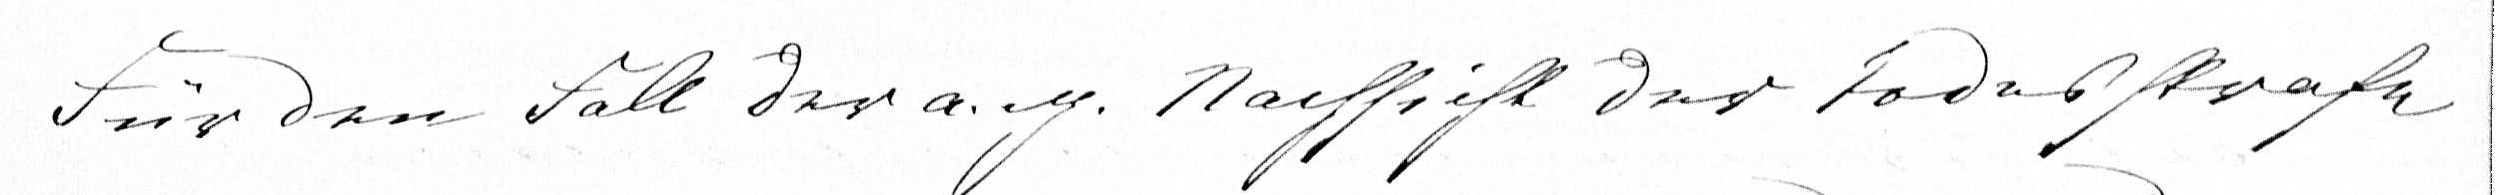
Für den Fall der a. g. Nachsicht der Todesstrafe
